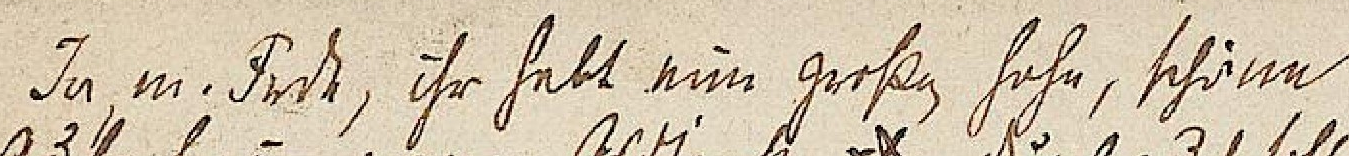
Ja, m. Frde, ihr hat eine große, hohe, schöne
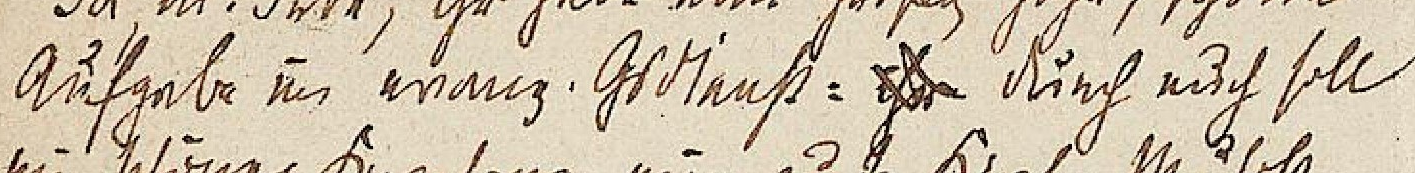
Aufgabe im evang. Gsdienst: ihr durch euch soll
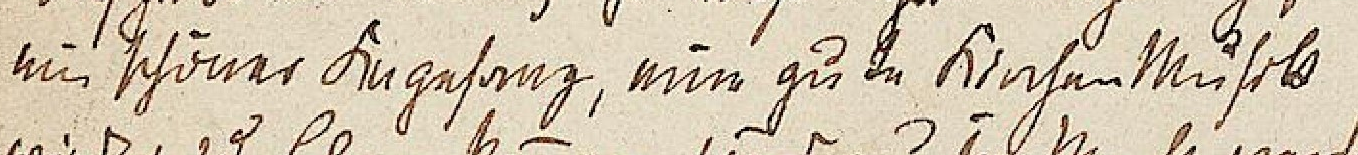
ein schöner Kngesang, eine gute Kirchen Musik
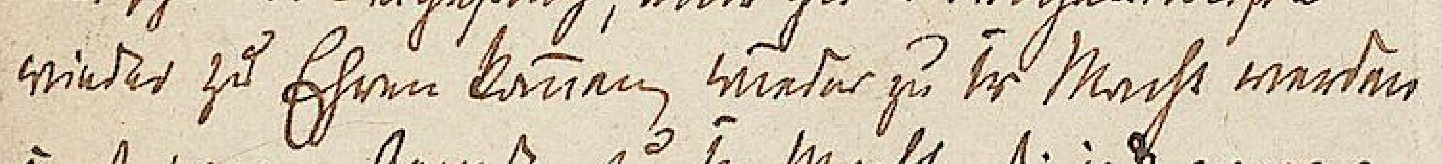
wieder zu Ehren komen, wieder zu 1r Macht werden
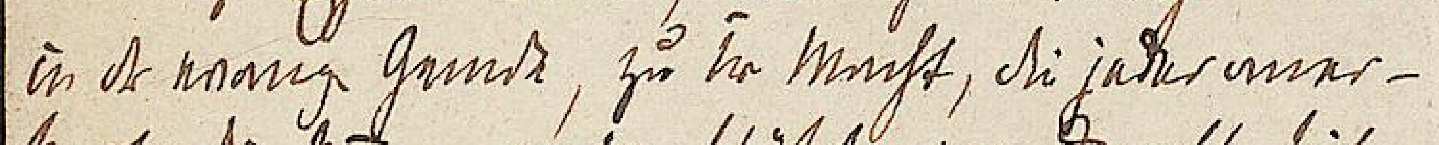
in dr evang. Gemde, zu 1r Macht, die jeder aner¬
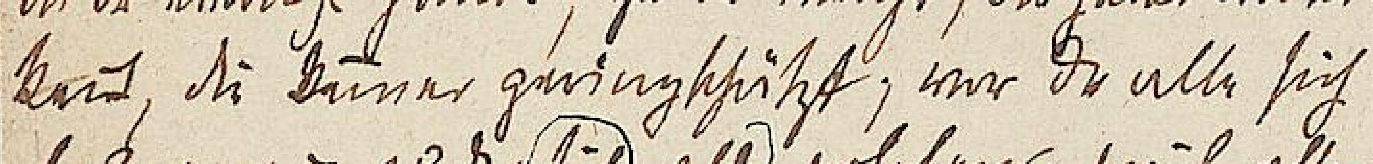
kennt, die keiner geringschätzt, vor der alle sich
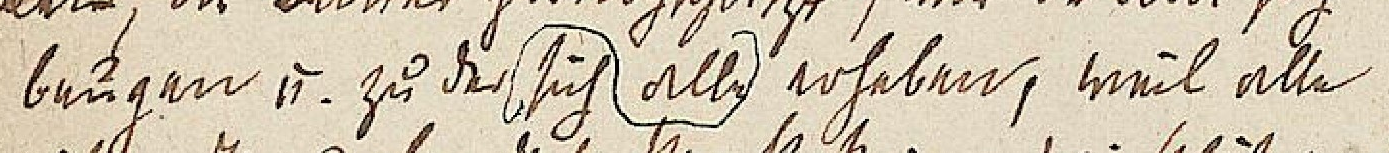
beugen u. zu der sich alle erheben, weil alle
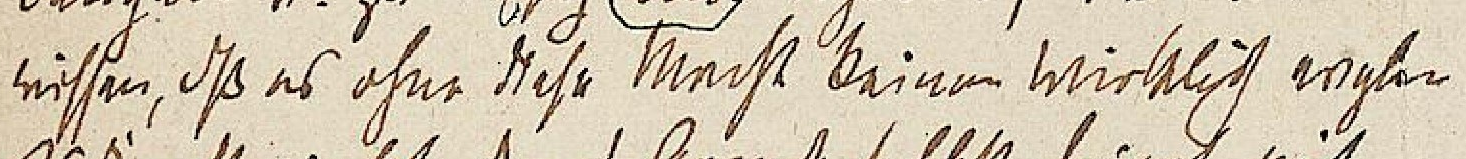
wissen, das es ohne diese Macht keinen wirklich evgln.
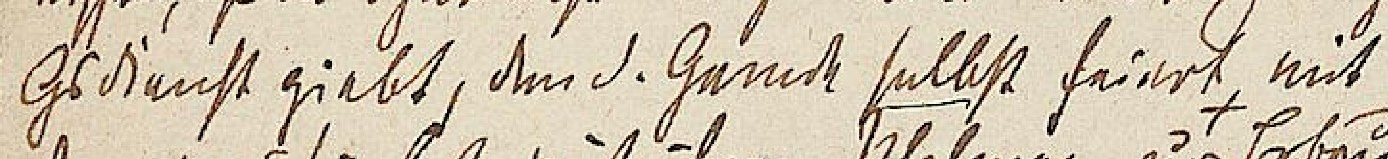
Gsdienst giebt, dem den d. Gemde selbst feiert mit
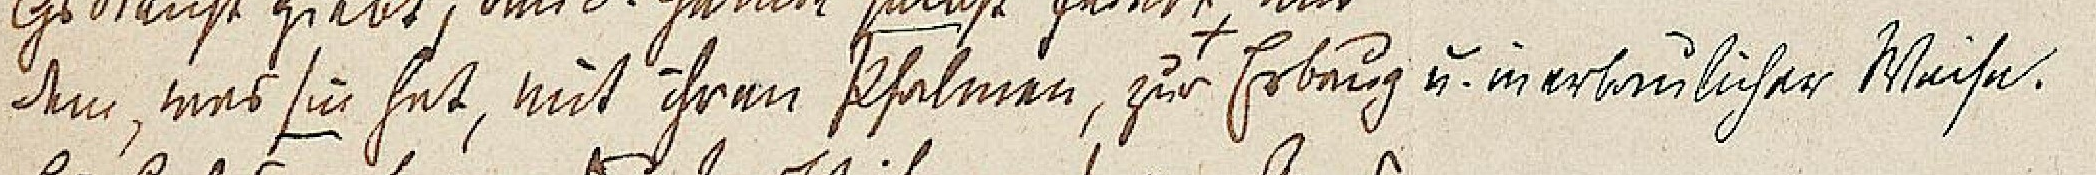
dem, was sie hat, mit ihren Psalmen, zur Erbaug u. in erbaulicher Weise.
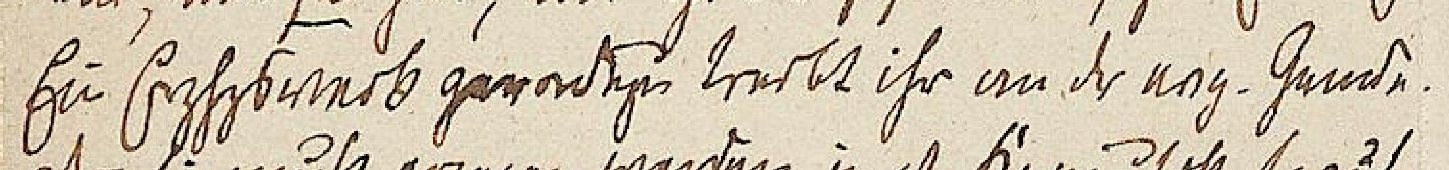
Ein Erzhgswerk geradezu treibt ihr an der evg. Gemde.
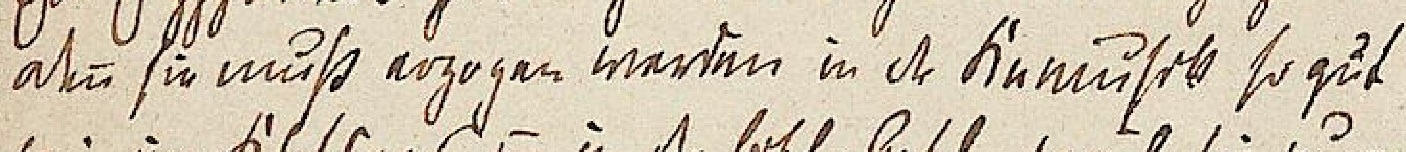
Den sie must erzogen werden in der Knmusik so gut
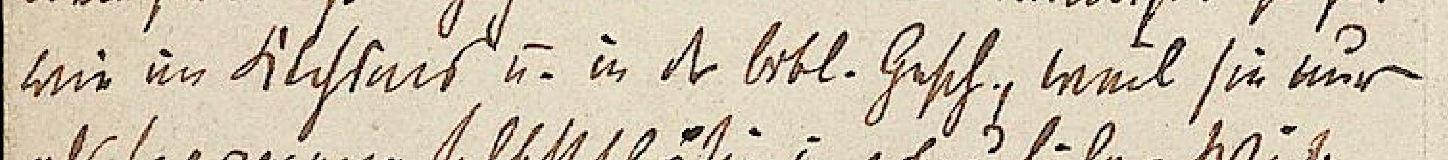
wie im Ktchsms u. in der bibl. Gesch, weil sie nur
